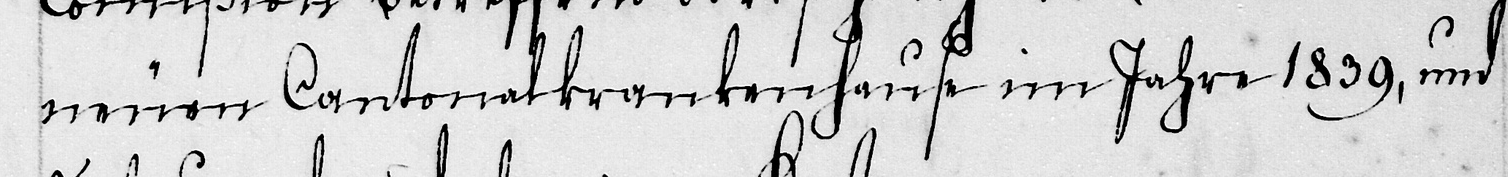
neuen Cantonalkrankenhause im Jahre 1839, und
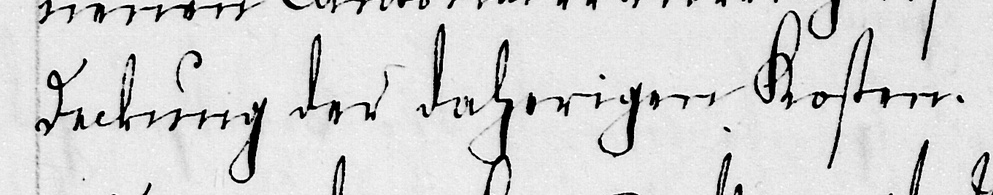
Deckung der daherigen Kosten.
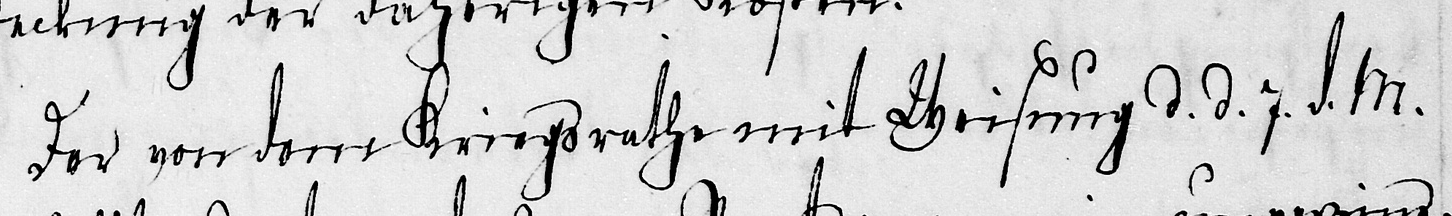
Der von dem Kriegsrathe mit Weisung d. d. 7. d. M.
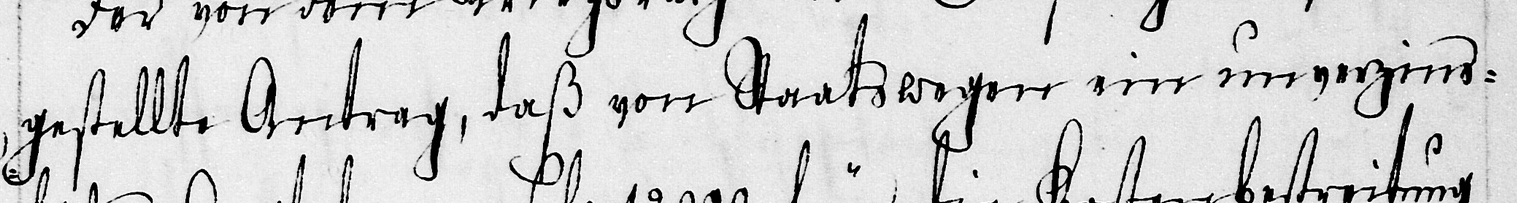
gestellte Antrag, daß von Staatswegen ein unverzins¬
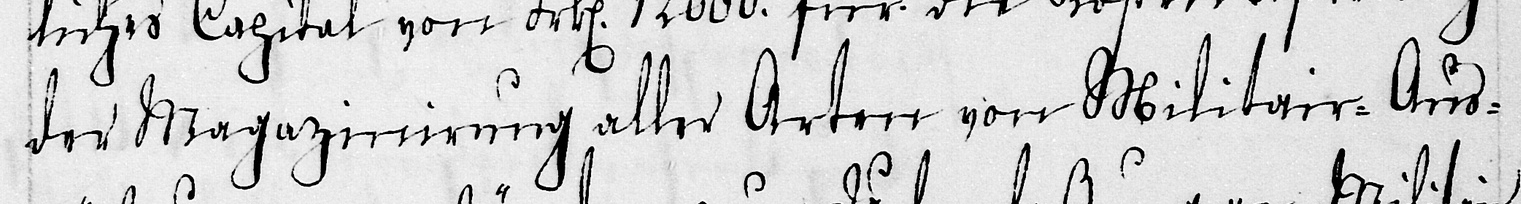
der Magazinirung aller Arten von Militair-Aus¬
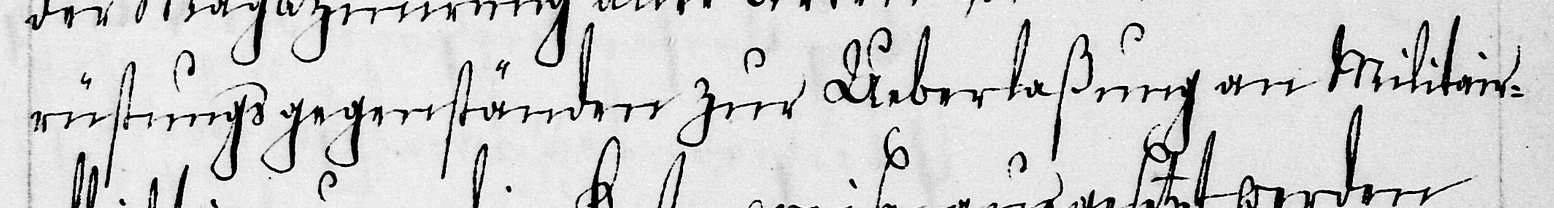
rüstungsgegenständen zur Ueberlaßung an Militair¬
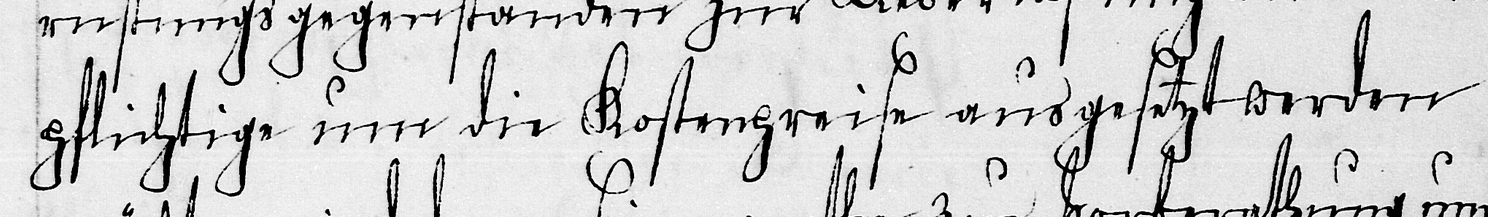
pflichtige um die Kostenpreise ausgesetzt werden
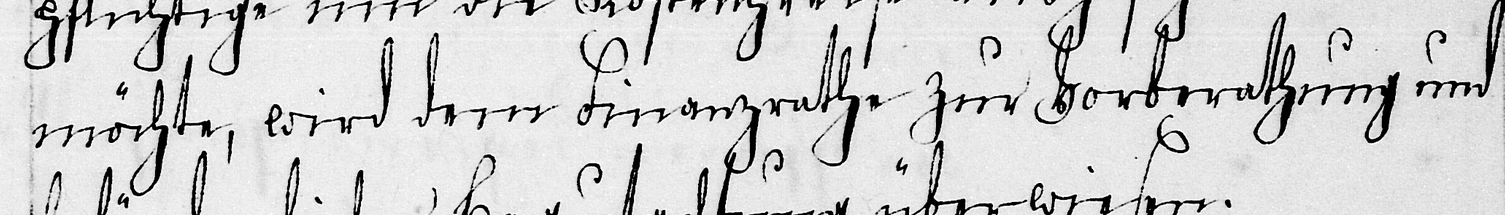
möchte, wird dem Finanzrathe zur Vorberathung und
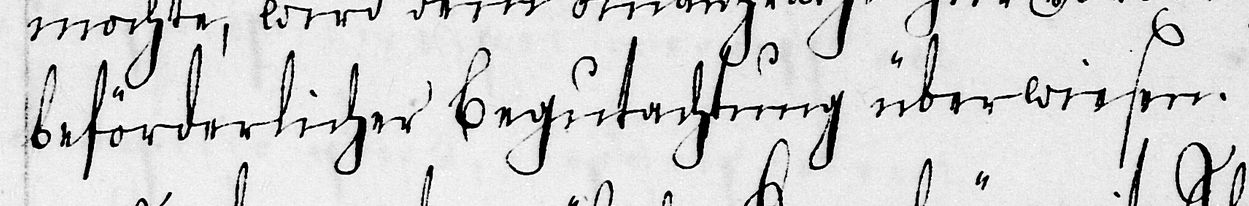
beförderlicher Begutachtung überwiesen.
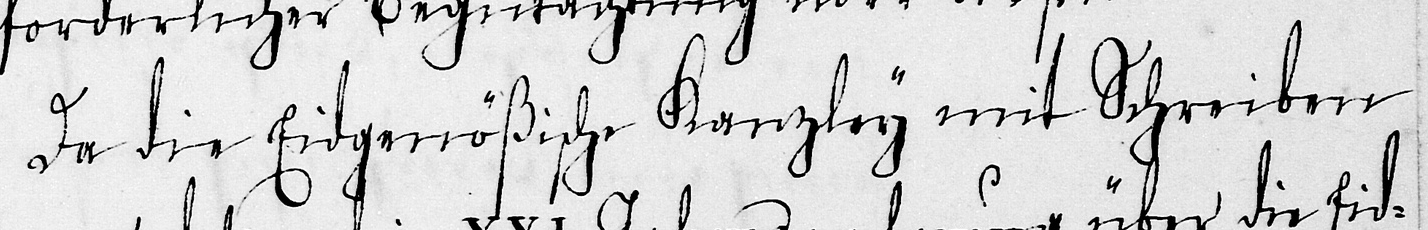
Da die Eidgenößische Kanzley mit Schreiben
